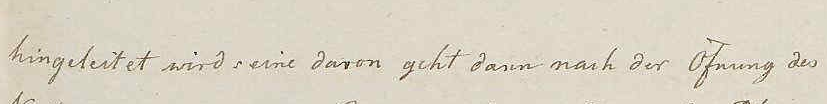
hingeleitet wird: eine davon geht dann nach der Öfnung des
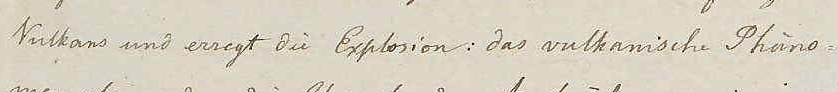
Vulkans und erregt die Explosion: das vulkanische Phäno-
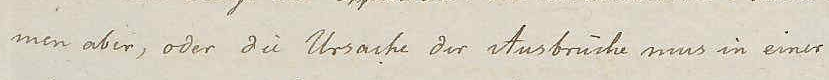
men aber, oder die Ursache der Ausbrüche mus in einer
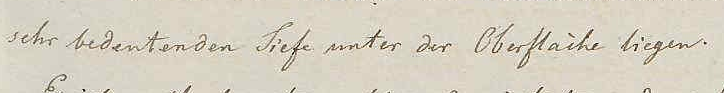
sehr bedeutenden Tiefe unter der Oberfläche liegen.
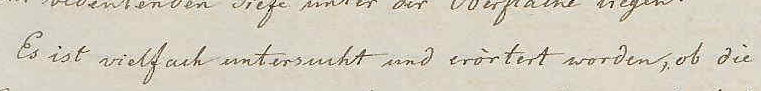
Es ist vielfach untersucht und erörtert worden, ob die
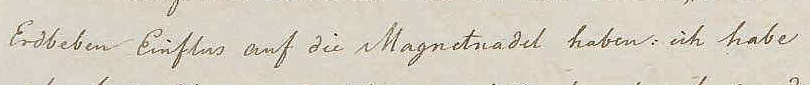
Erdbeben Einflus auf die Magnetnadeln haben: ich habe
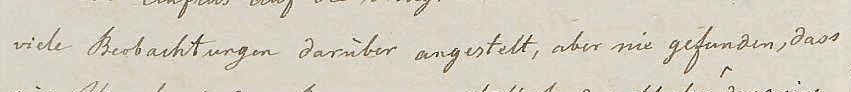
viele Beobachtungen darüber angestelt, aber nie gefunden, dass
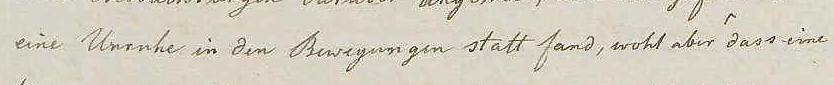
eine Ursache in den Bewegungen statt fand, wohl aber dass eine
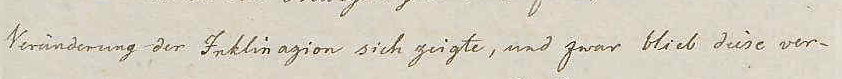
Veränderung der Inklinazion sich zeigte, und zwar blieb dies ver-
